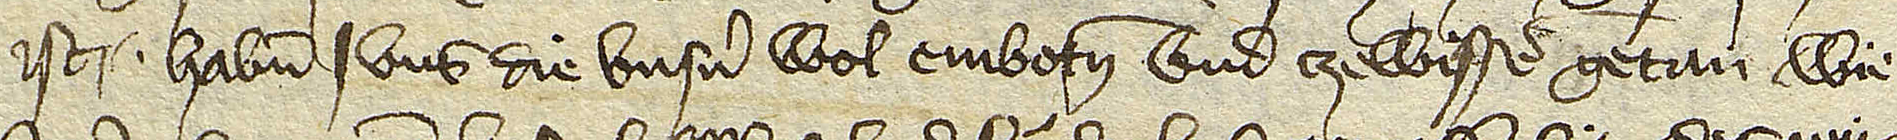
iſt / . habn* / vns die vnſn* wol embotn* vnd cʒewiſſe* getan / wie
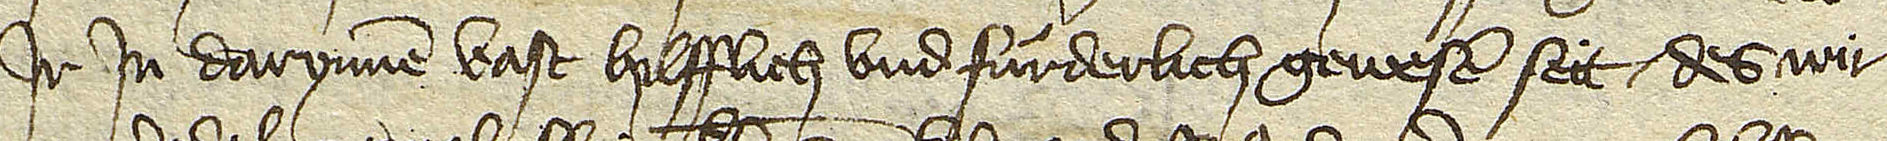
Ir In darynne* vaſt hilfflich vnd fürderlich geweſe* ſeit / des wir
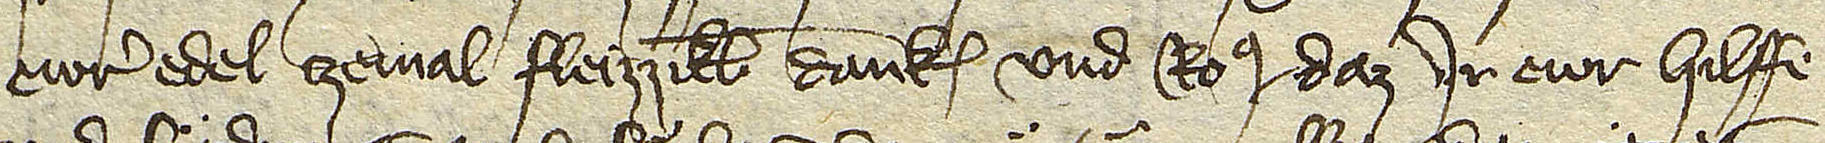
ewr* edel cʒemal fleiʒʒikl* dank* vnd Ro* / daʒ Ir ewr hilffe
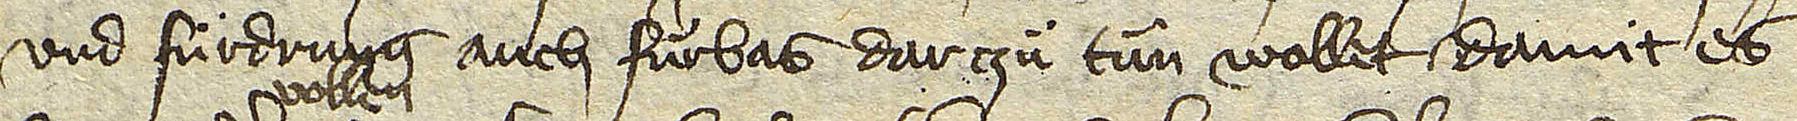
vnd fürdrung auch fürbas dar cʒü tün wollet / damit es
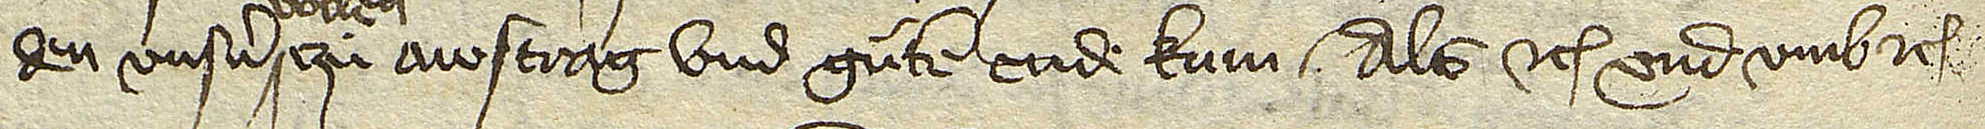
den vnſn* awſtrag vnd güte end kum / Als ec* vnd vmb ec*
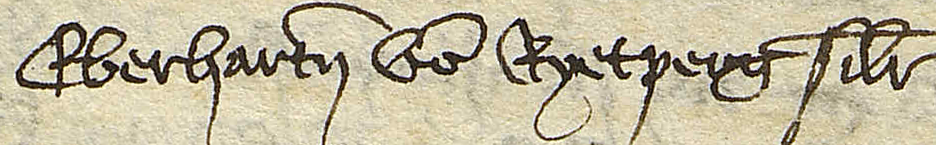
Eberhartn* vo* Ryetperg* ſilr*
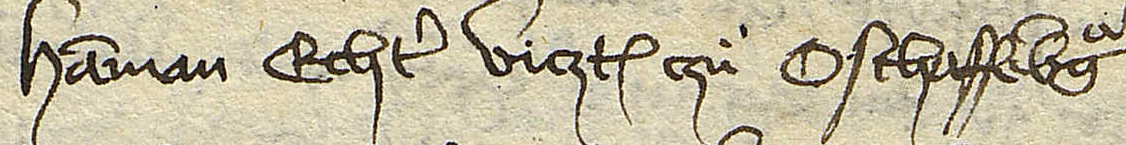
Ha*man Echt* Vicʒt* cʒü Oſchaffe*b*g
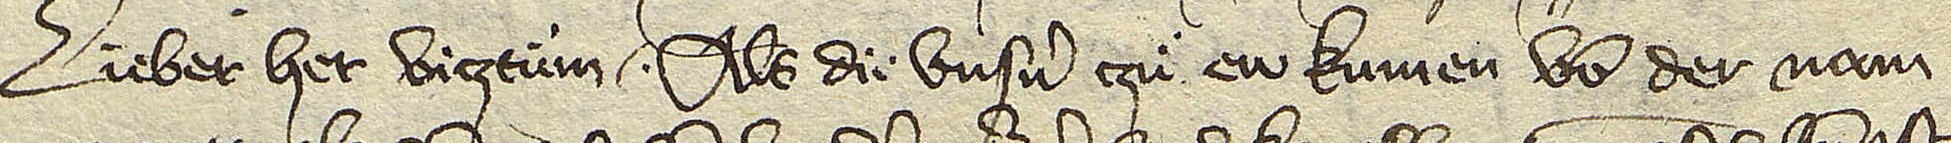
Lieber her vicʒtüm / . Als die vnſn* cʒü ew kumen vo* der nam
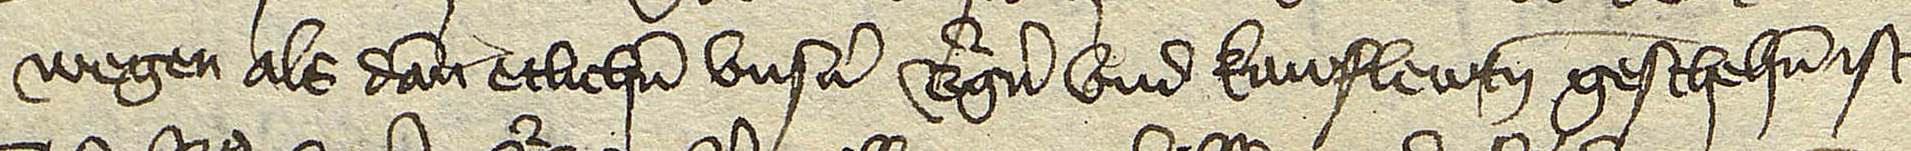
wegen als dan* etlichn* vnſn* B*gn* vnd kawflewtn* geſchehn* iſt
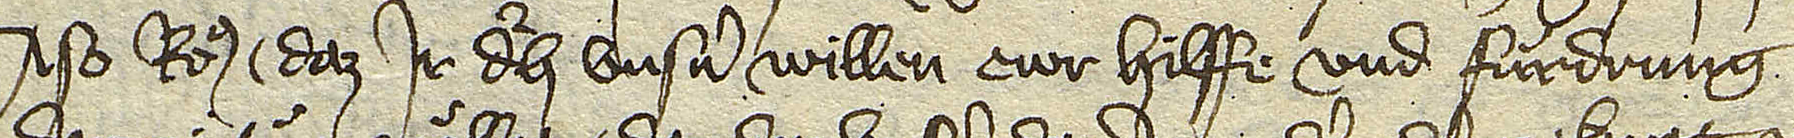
Alſo Ro* / daʒ Ir d*h vnſn* willen ewr hilffe vnd fürdrung
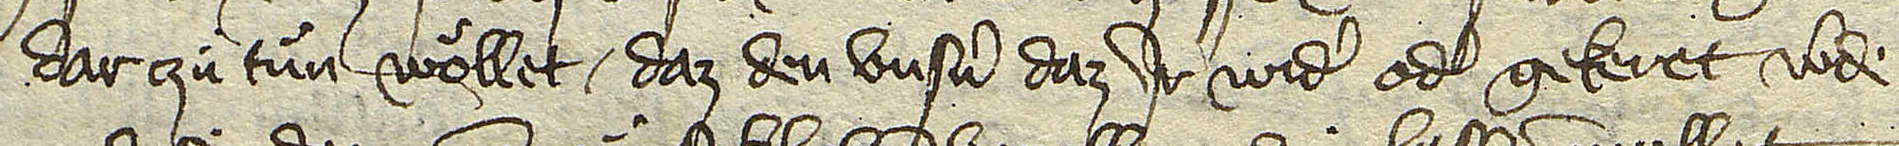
dar cʒü tun wöllet / daʒ den vnſn* daʒ Ir wid* od* gekeret w*d
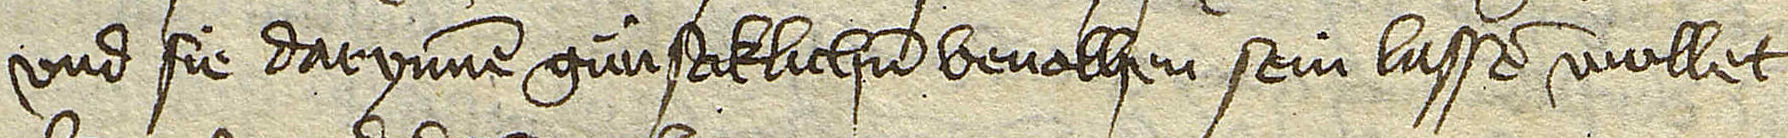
vnd ſie darynne* günſtiklichn* beuolhen ſein laſſe* wollet
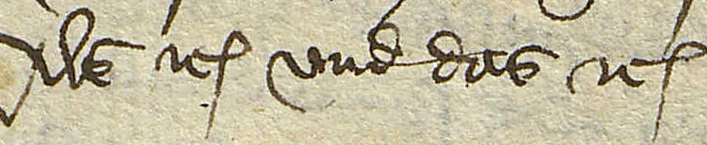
Als ec* vnd das ec*
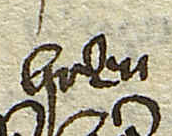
hr*en
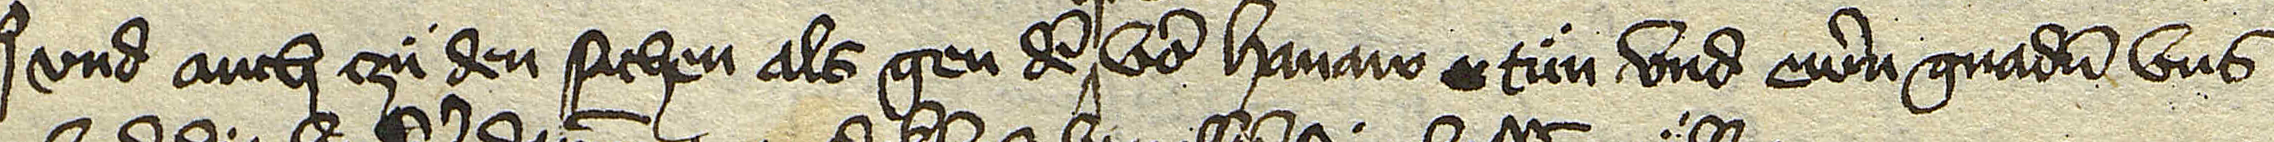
vnd auch cʒü den ſachen als gen d* vo* hanaw tün / vnd ew*n gnadn* vns
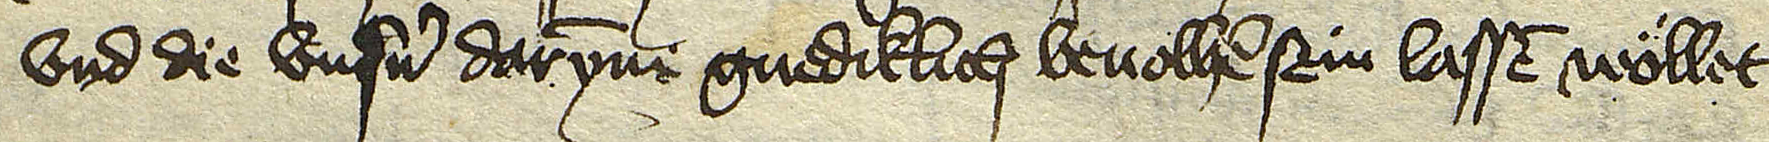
vnd die vnſn* daryne* gnediklich beuolhe* ſein laſſe* wöllet
